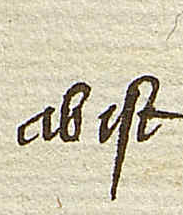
ab iſt
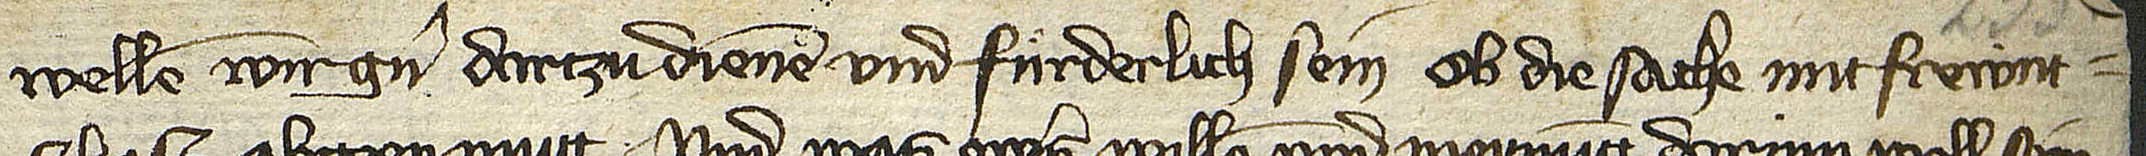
welle* wir g*n darʒu diene* vnd fürderlich ſein Ob die ſache mit frewnt =
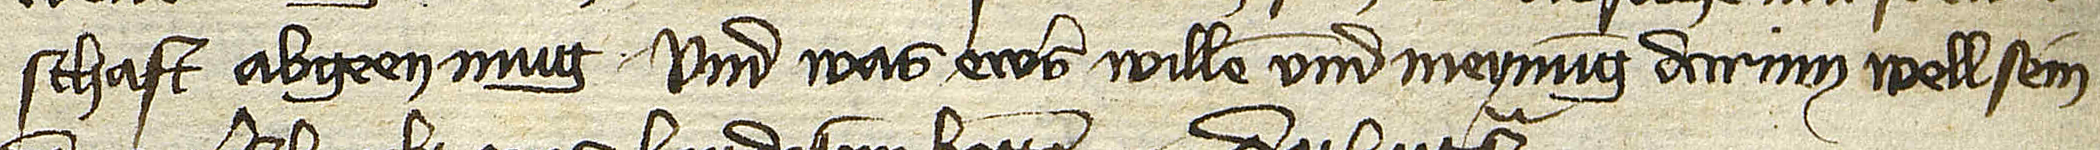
ſchaft abgeen mug / Vnd was ew*s wille* vnd meynu*g darinn well ſein
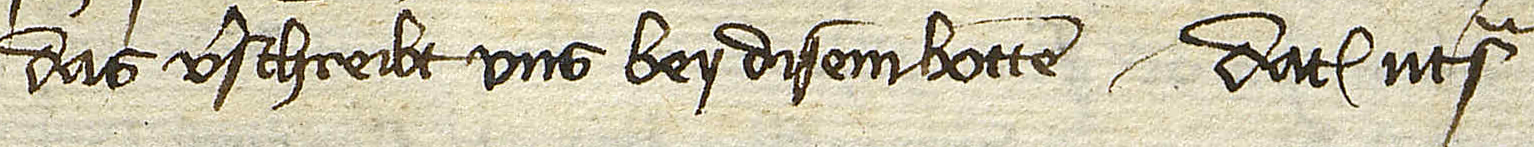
das v*ſchreibt vns bey diſem botte* / Dat* ut ſ*
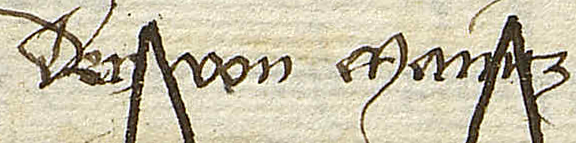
Den von Maincʒ
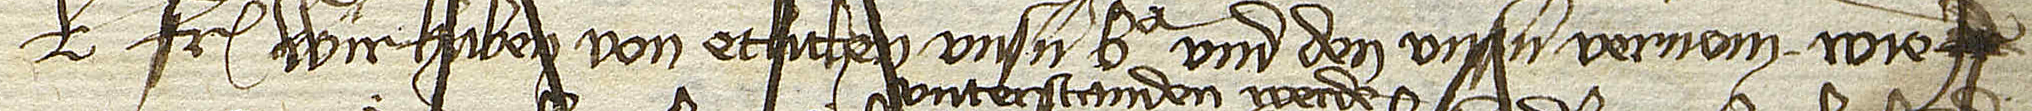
L* fr* Wir haben von etlichen vnſ*n b* vnd den vnſ*n vernom* . wie Ir
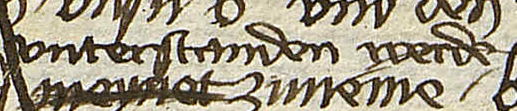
vnterſtanden werde
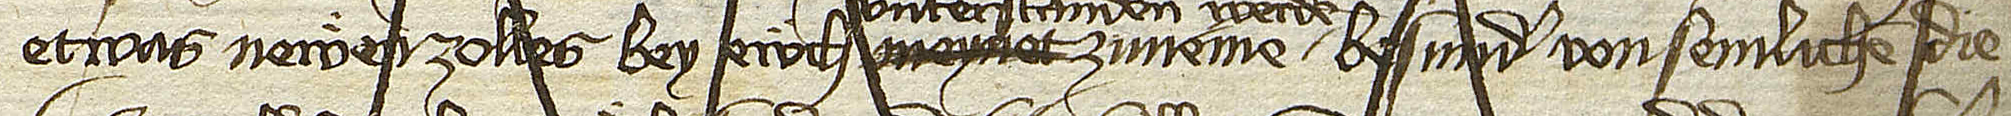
etwas newen ʒolles bey ewch meynot ʒuneme* / beſund* von ſemliche* die
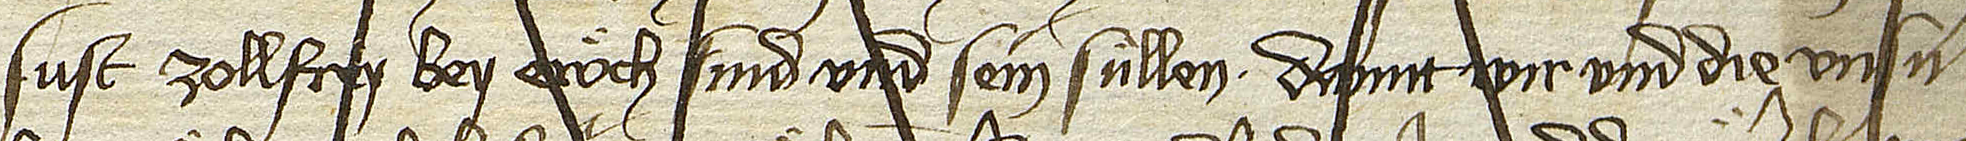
ſuſt ʒollfrey bey ewch ſind vnd ſein ſüllen . damit wir vnd die vnſ*n
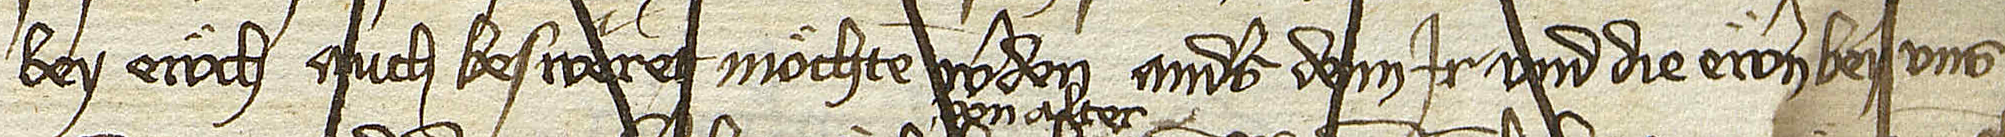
bey ewch auch beſwëret möchte* w*den and*s denn Ir vnd die ew*n bey vns
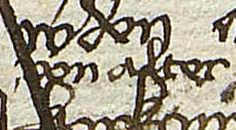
von alter
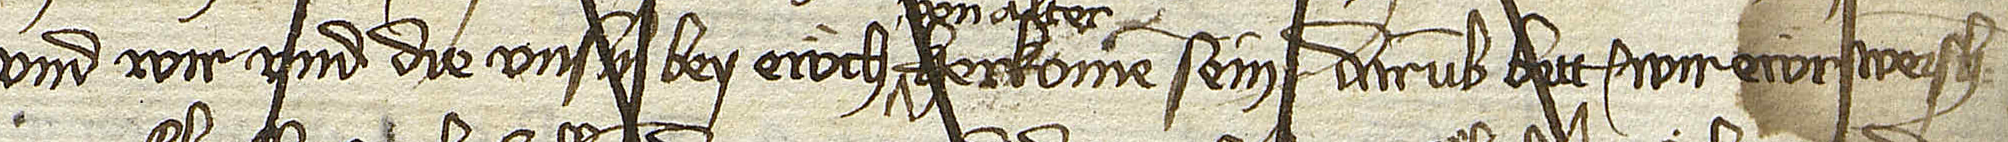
vnd wir vnd die vnſ*n bey ewch herkome* ſein daru*b bett* wir ewr weiſh*
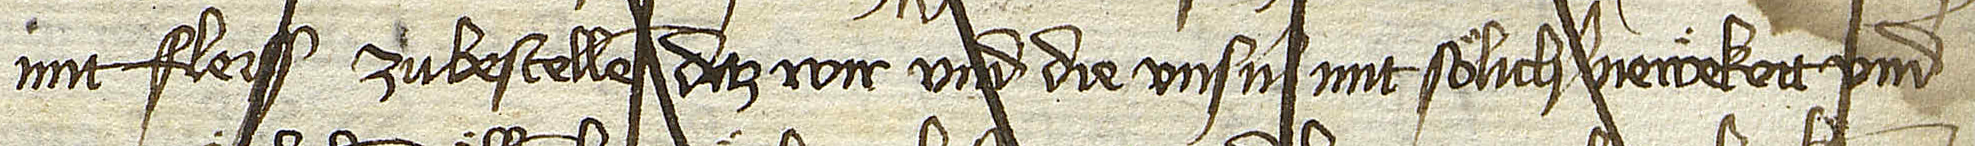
mit fleiſſ ʒubeſtelle* daʒ wir vnd die vnſ*n mit ſölich* newekeit vnd
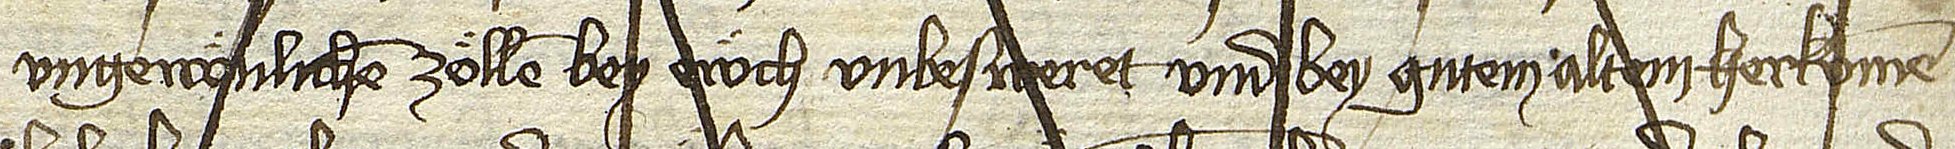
vngewönliche* ʒölle* bey ewch vnbeſweret vnd bey gutem altem herkome*
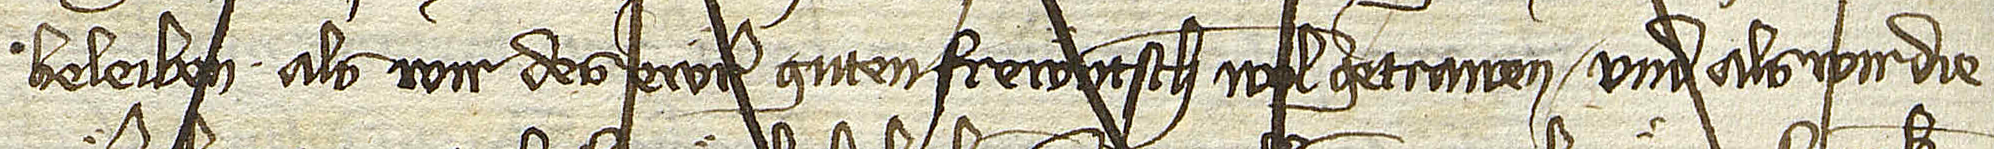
beleiben . als wir des ew*r guten frewntſch* wol getrawen / vnd als wir die
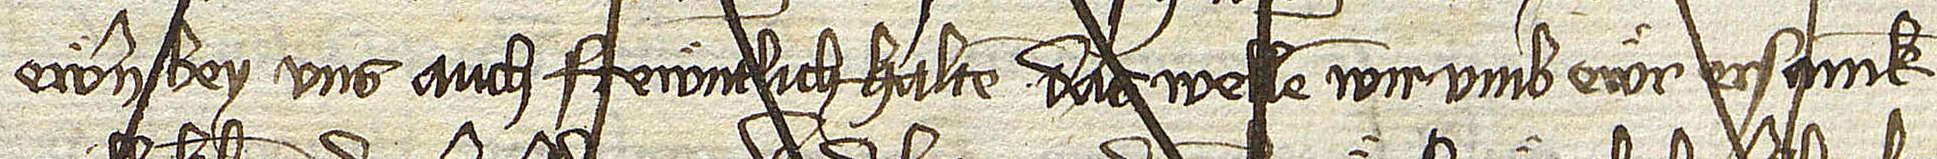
ew*n bey vns auch frewntlich halte* . das welle* wir vmb ewr erſamk*
